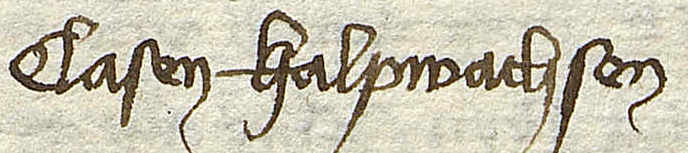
Claſen Halpwachſen
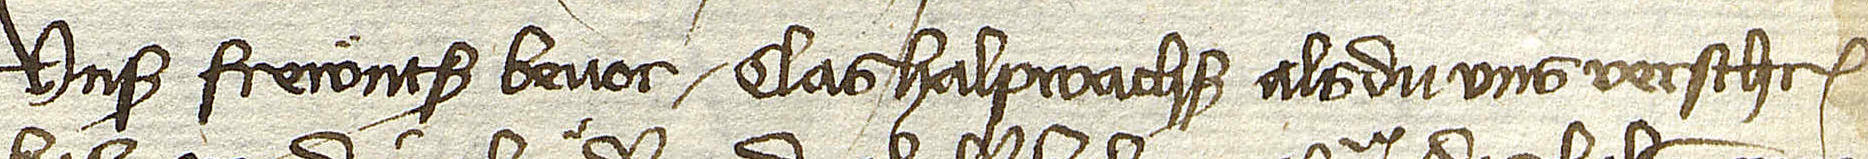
Vnſ* frewntſ* beuor / Clas halpwachſ* als du vns verſchr*
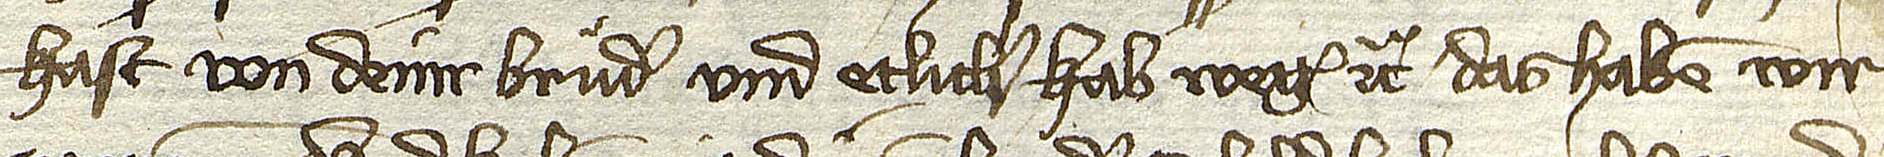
haſt von deinr brüd* vnd etlich* hab weg* ec* / das habe* wir
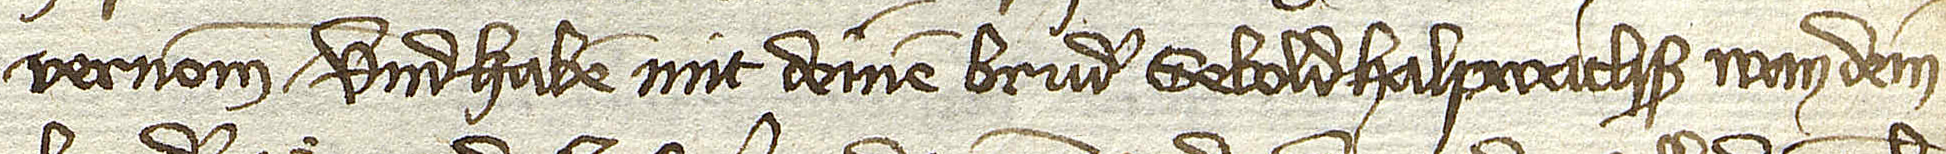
vernom* / Vnd habe* mit deine* brud* Sebold halpwachſ* wan dein
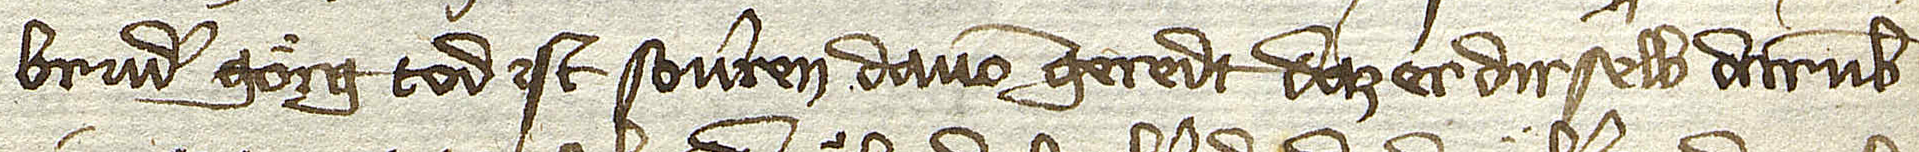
brud* görg tod iſt ſou*ren dauo* geredt daʒ er dir ſelb daru*b
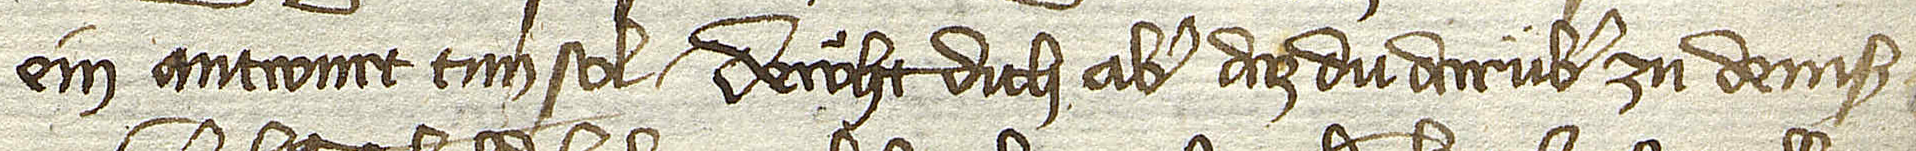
ein antwurt tun ſol / Dewcht dich ab* daʒ du darüb* ʒu demſ*
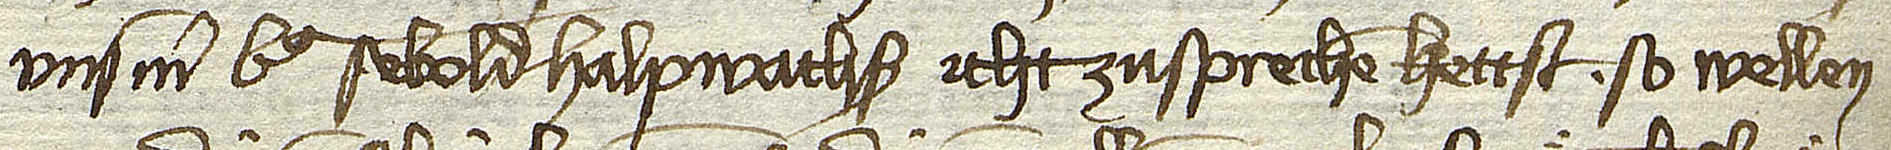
vnſ*m b* ſbold halpwachſ* icht ʒuſpreche* hettſt . ſo wellen
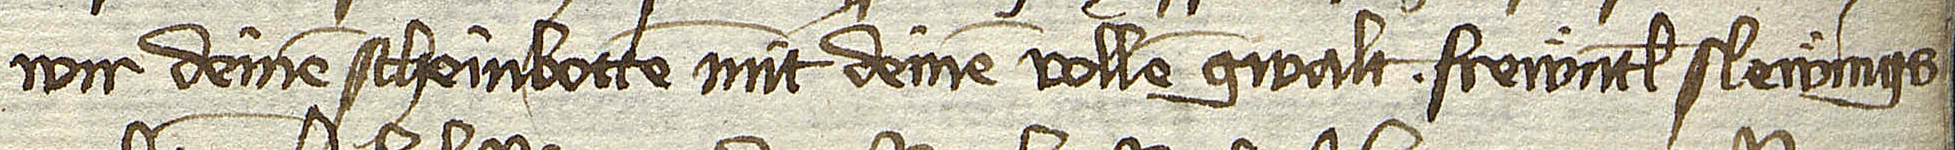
wir deine* ſcheinbotte* mit deine* volle* gwalt . frewntl* ſlewnigs
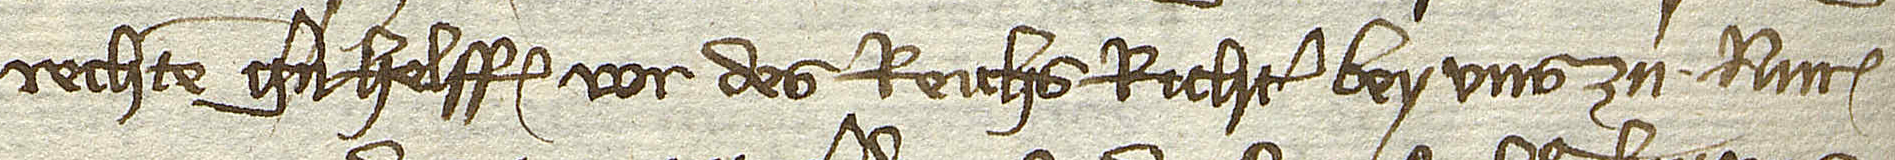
rechte* g*n helff* vor des Reichs Richt* bey vns ʒu . Nur*
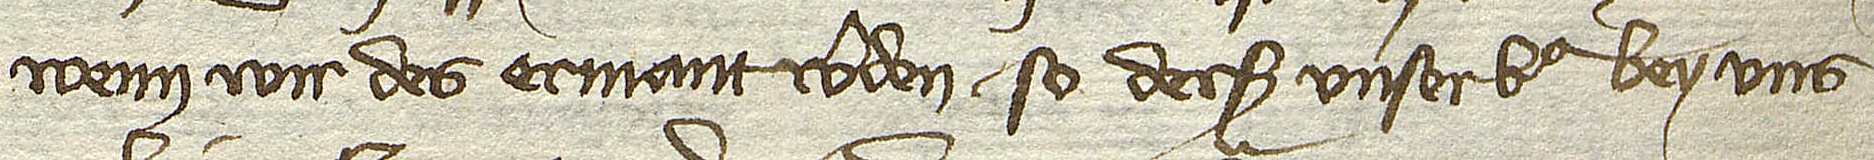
wenn wir des ermant w*den / ſo derſ* vnſer b* bey vns
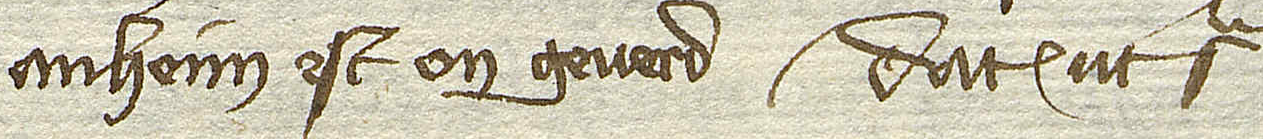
anheim iſt on geuerd / Dat* ut ſ*
